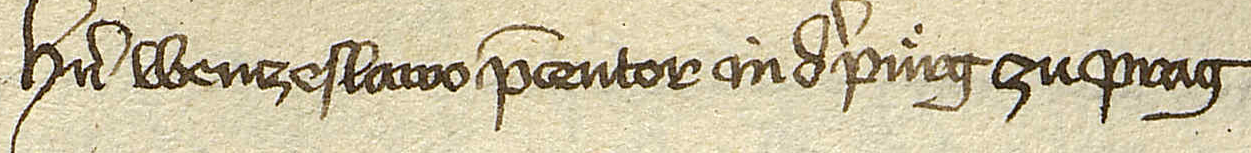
Hn* Wencʒelſlawo p*centor in d* Pürg cʒu Prag
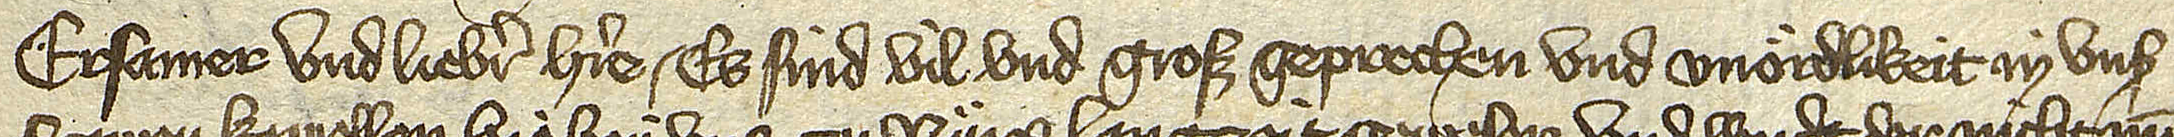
Erſamer vnd liebr* h*re / Es ſind vil vnd groſʒ geprechen vnd vnördlikeit in vnſ*
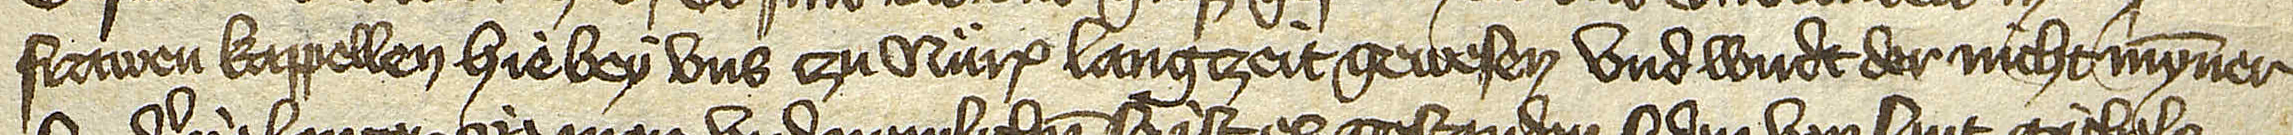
frawen kappellen hie bey vns cʒu Nür* langcʒeit geweſen vnd wirdt der nicht myner*
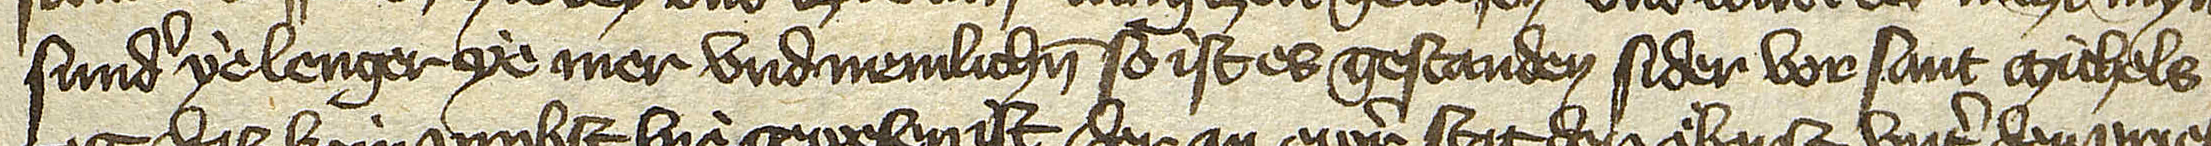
ſund* ye lenger ye mer vnd nemlichn* ſo iſt es geſtanden ſider vor ſant Michels
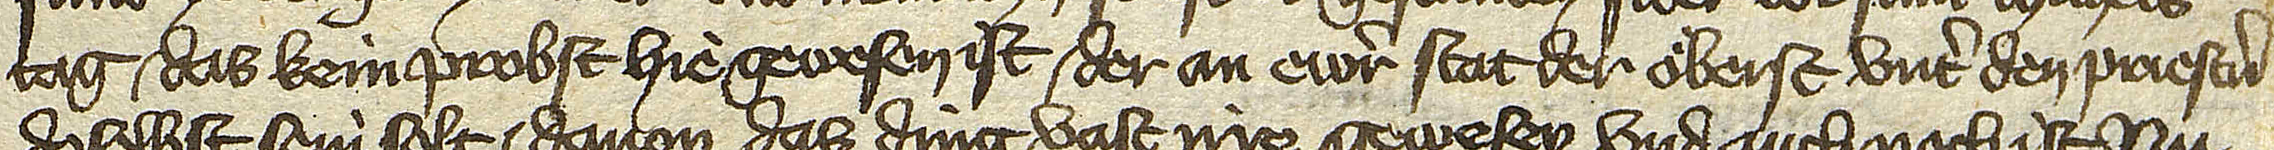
tag / das kein probſt hie geweſen iſt / der an ewr* ſtat der öberſt vnt* den prieſtn*
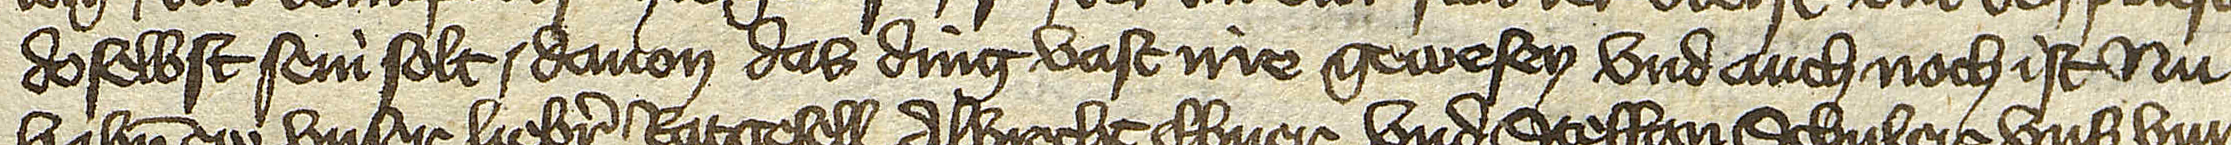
doſelbſt ſein ſolt / dauon das ding vaſt nie geweſen vnd auch noch iſt Nu
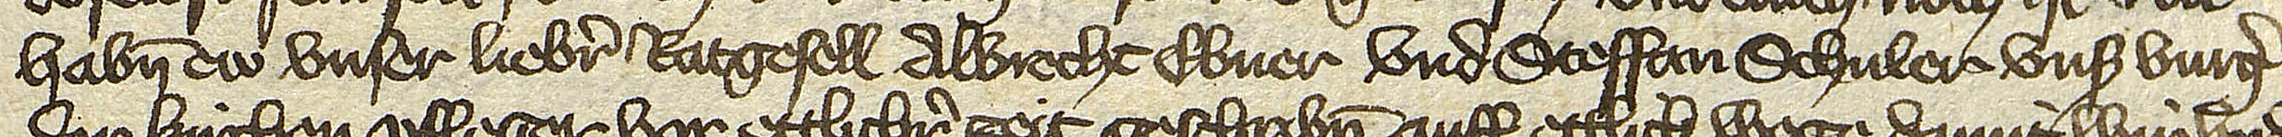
habn* ew vnſer liebr* Ratgeſell Albrecht Ebner vnd Steffan Schuler vnſ* burg*
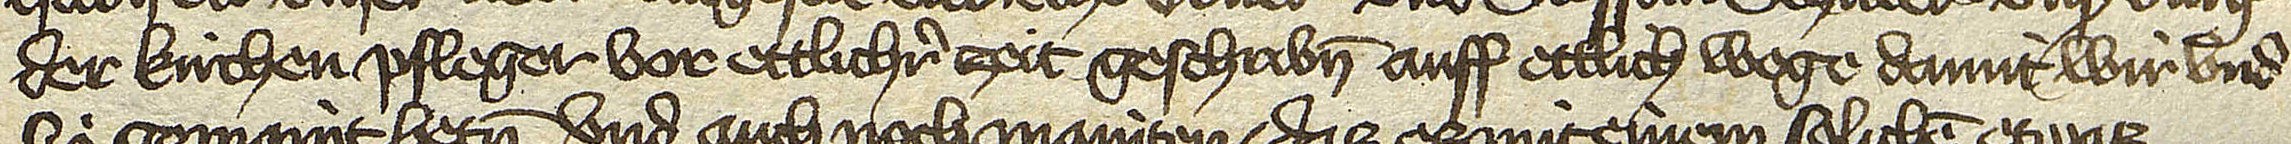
der kirchen pfleger vor ettlichr* cʒeit geſchribn* auff ettlich wege damit wir vnd
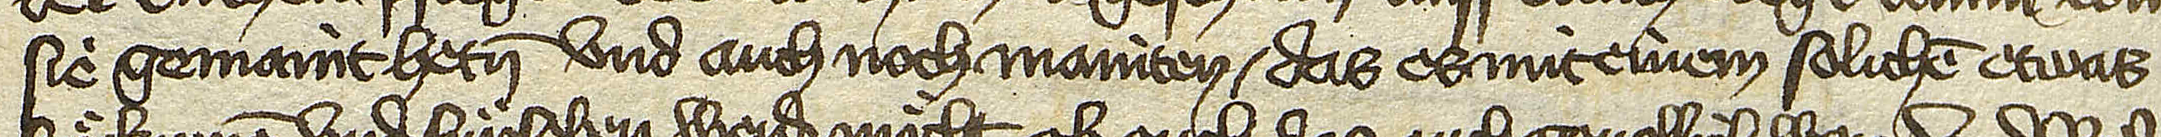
ſie gemaint hetn* vnd auch noch mainten / das es mit einem ſoliche* etwas
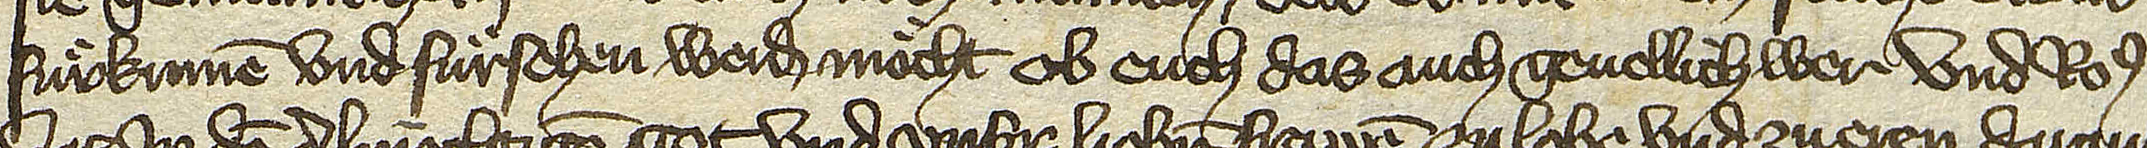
fürkume* vnd fürſehen werd* möht ob euch das auch geuellich wer vnd Ro*
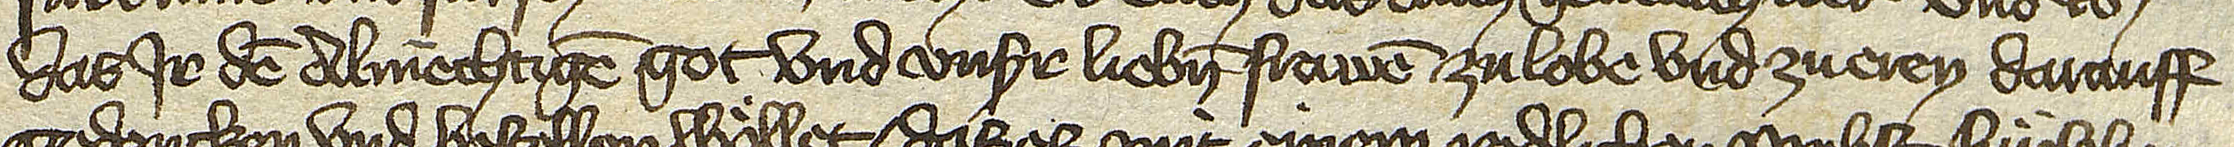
das Ir de* Almechtige* got vnd vnſ*r liebn* frawe cʒulobe vnd cʒueren darauff
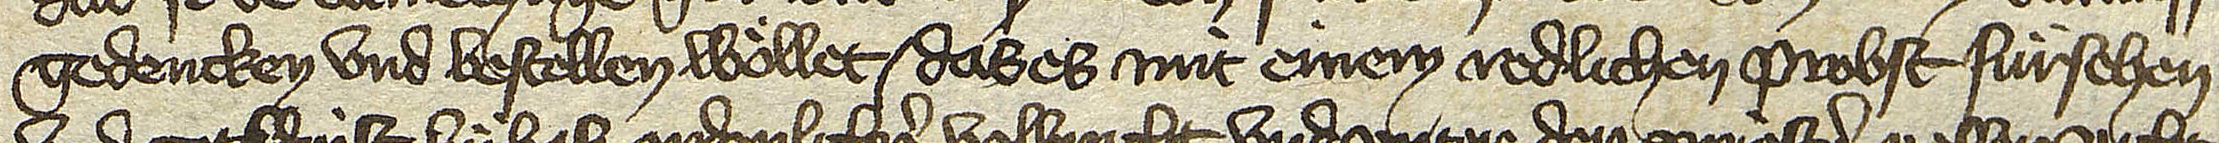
gedencken vnd beſtellen wöllet / das es mit einem redlichen Probſt fürſehen
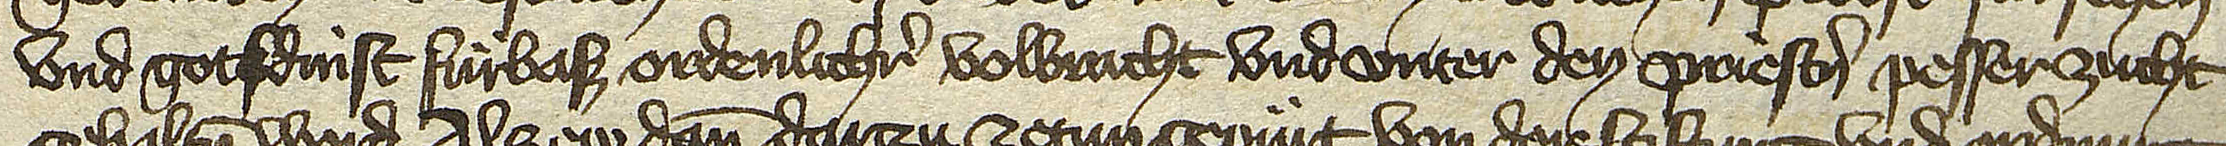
vnd gotſdinſt fürbas ordenlichr* volbracht vnd vnter den prieſtn* peſſer cʒucht
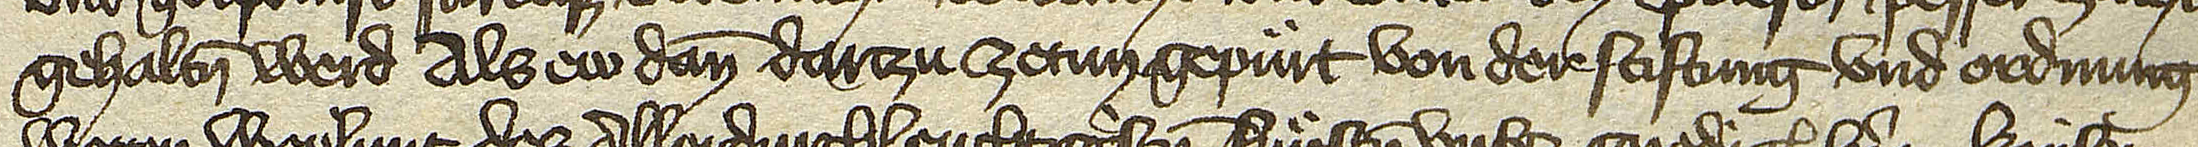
gehaltn* werd Als ew dan* darcʒu cʒetun gepürt von der ſtiftung vnd ordnung
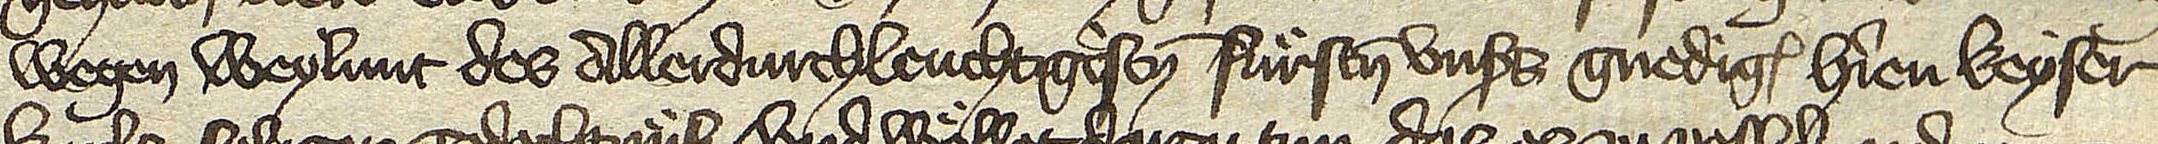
wegen weylunt des Allerdurchleuchtigiſtn* fürſtn* vnſ*s gnedig* h*ren keyſer
